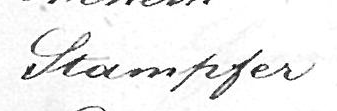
Stampfer
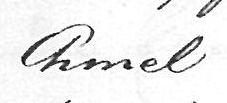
Chmel
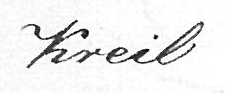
Kreil
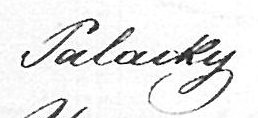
Palacky
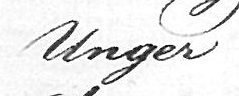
Unger
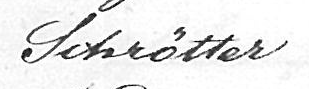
Schrötter
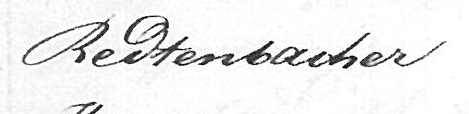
Redtenbacher
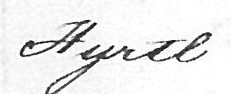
Hyrtl
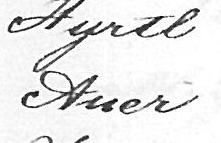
Auer
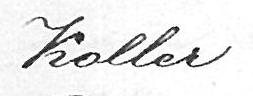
Koller
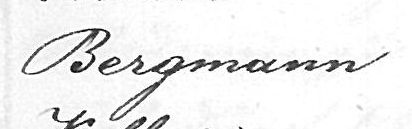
Bergmann
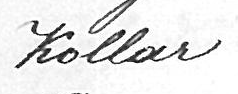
Kollar
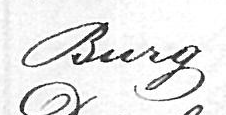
Burg
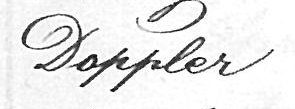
Doppler
